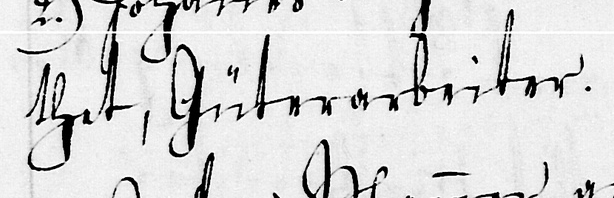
thet, Güterarbeiter.
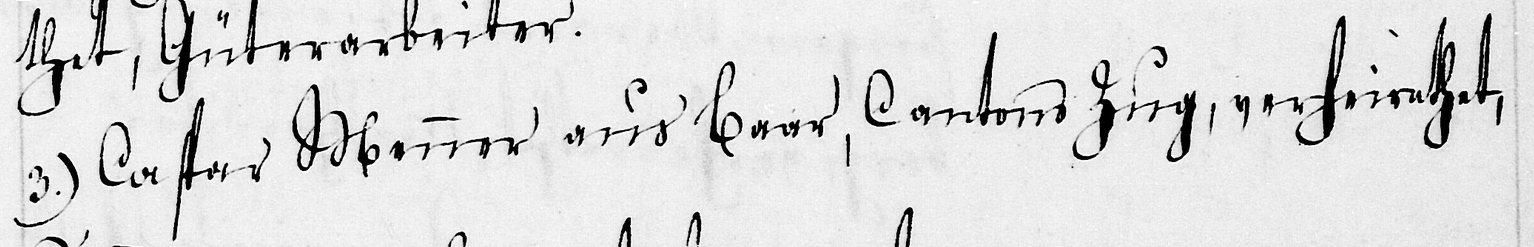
3.) Caspar Menner aus Baar, Cantons Zug, verheirathet,
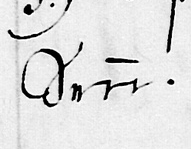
Senn.
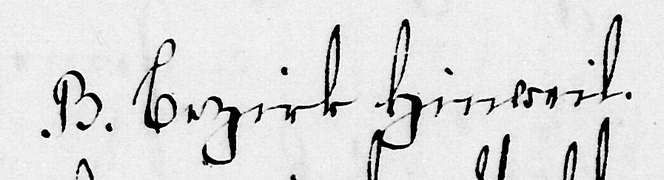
B. Bezirk Hinweil.
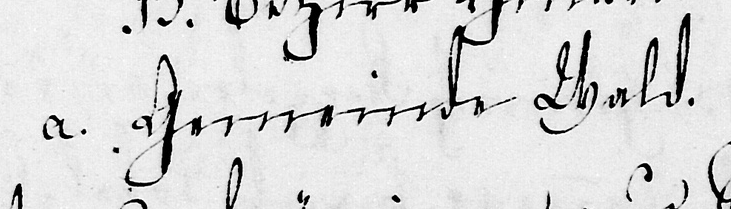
a. Gemeinde Wald.
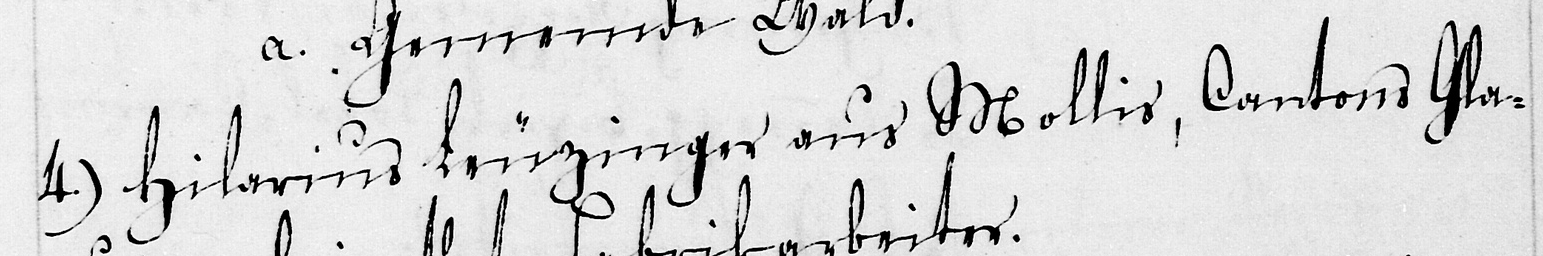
4.) Hilarius Leuzinger aus Mollis, Cantons Gla¬
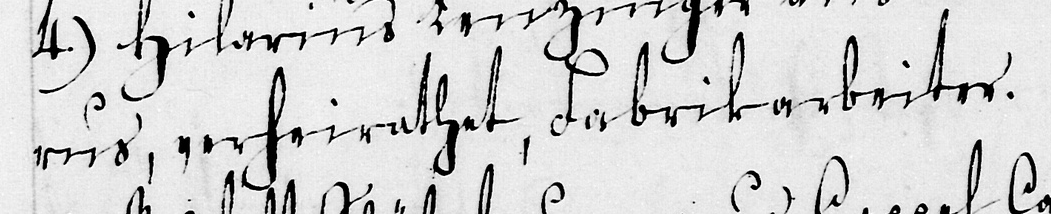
rus, verheirathet, Fabrikarbeiter.
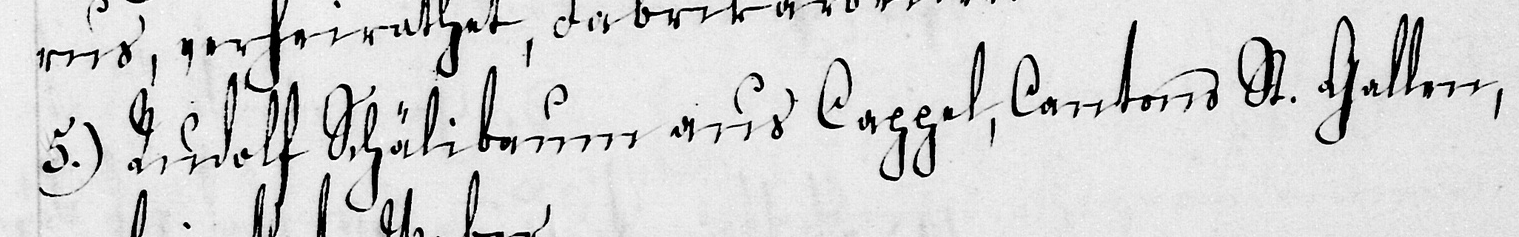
5.) Rudolf Schälibaum aus Cappel, Cantons St. Gallen,
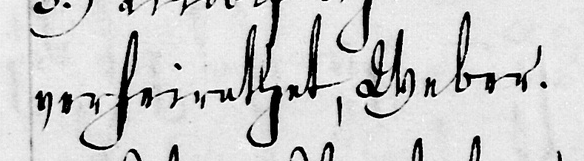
verheirathet, Weber.
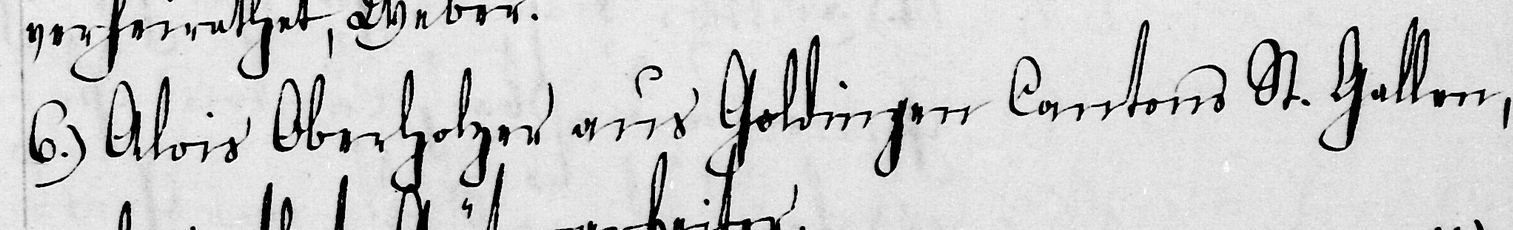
6.) Alois Oberholzer aus Goldingen Cantons St. Gallen,
